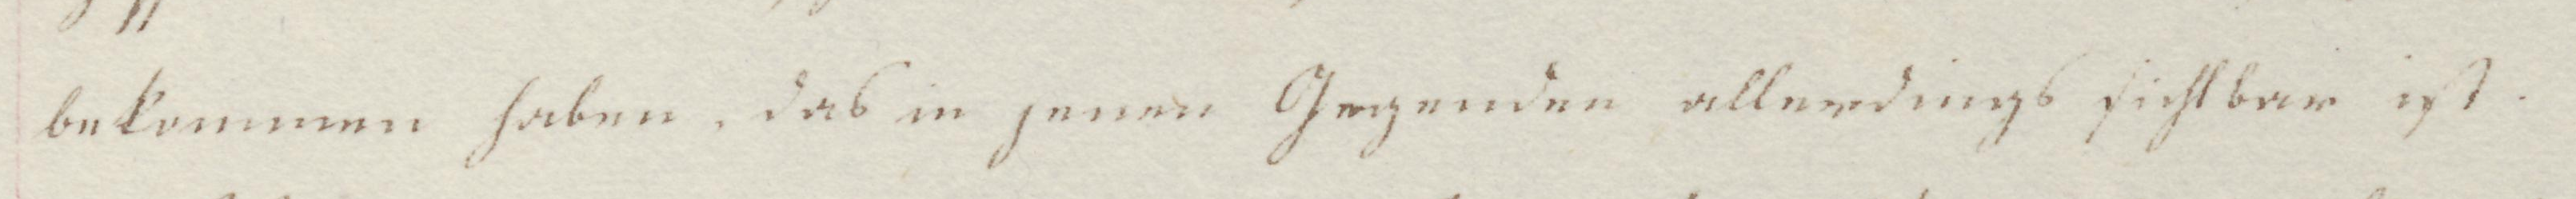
bekommen haben, das in jenen Gegenden allerdings sichtbar ist.
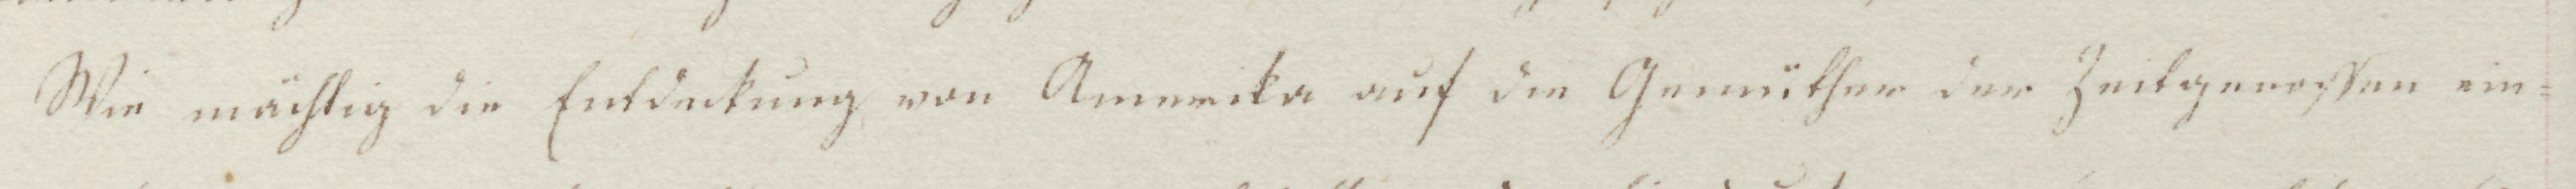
Wie mächtig die Entdeckung von Amerika auf die Gemüther der Zeitgenossen ein-
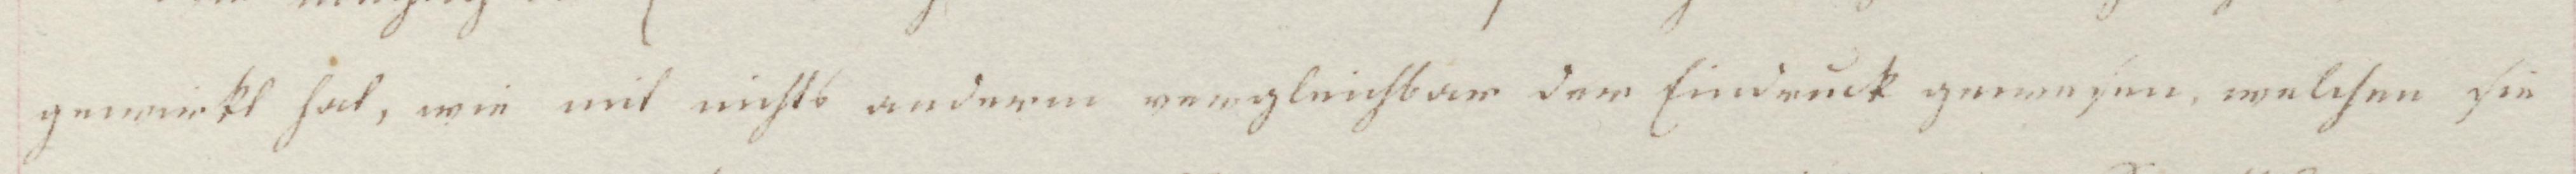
gewirkt hat, wie mit nichts anderm vergleichbar der Eindruck gewesen, welchen sie
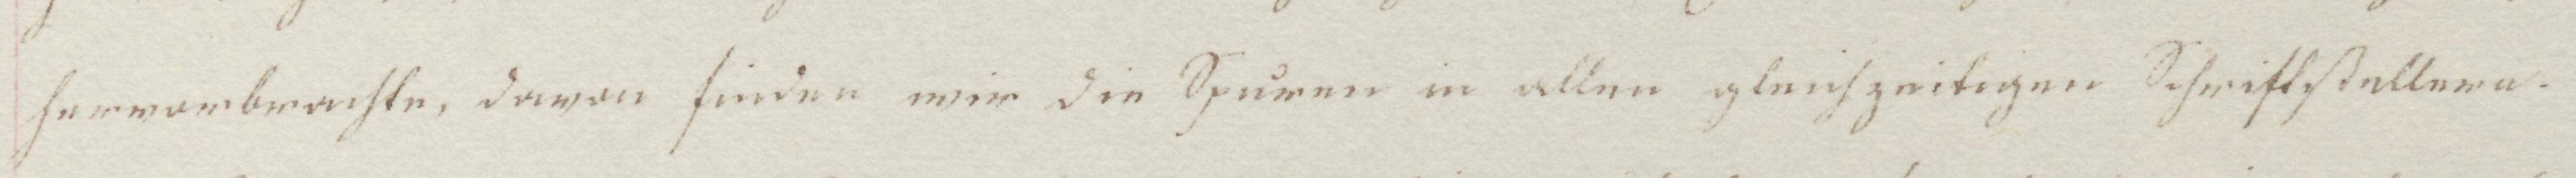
hervorbrachte, davon finden wir die Spuren in allen gleichzeitigen Schriftstellern.
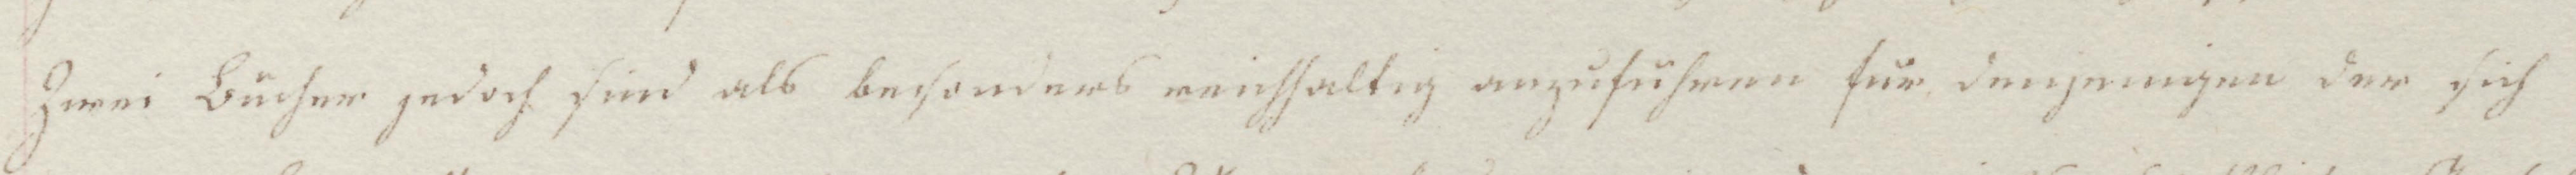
Zwei Bücher jedoch sind als besonders reichhaltig anzuführen für denjenigen der sich
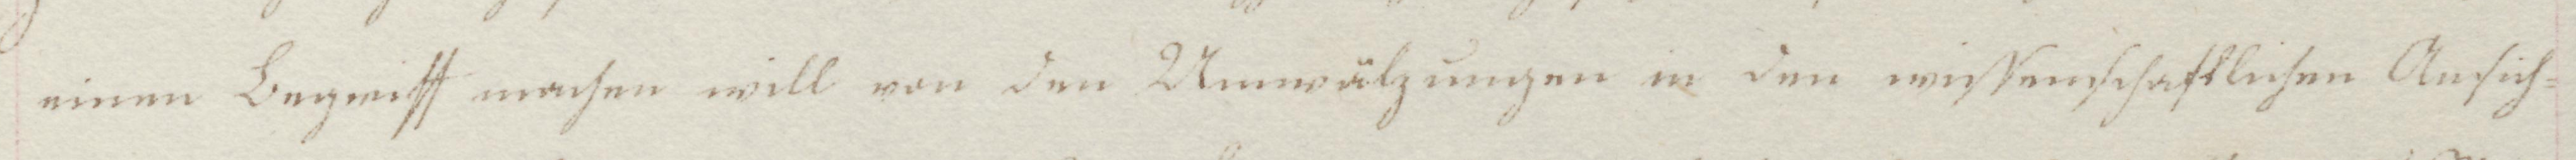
einen Begriff machen will von den Umwälzungen in den wissenschaftlichen Ansich-
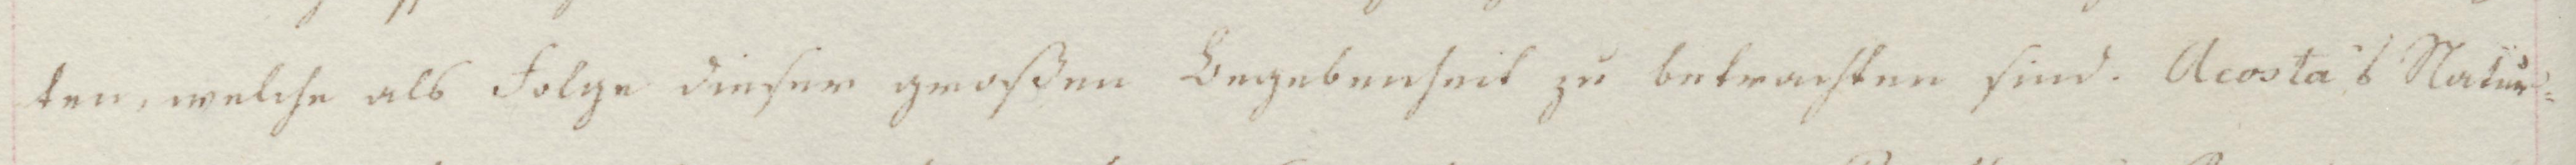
ten, welche als Folge dieser großen Begebenheit zu betrachten sind. Acosta's Natur-
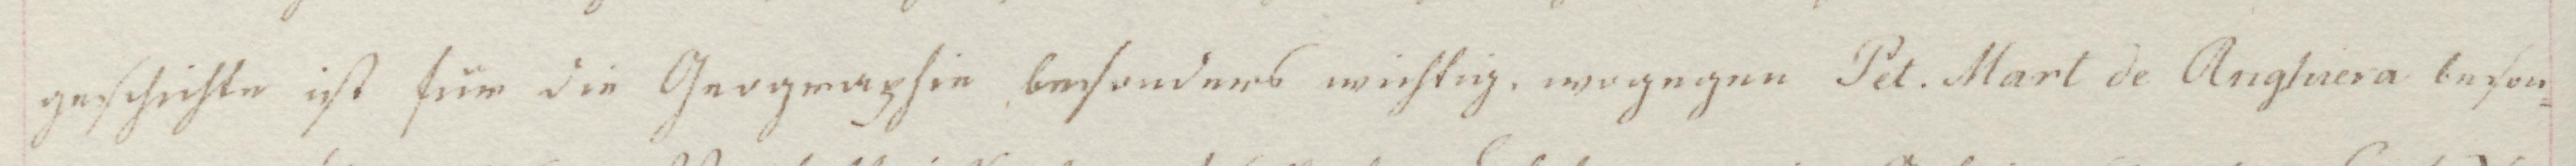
geschichte ist für die Geographie besonders wichtig, wogegen Pet. Mart. de Anghiera beson-
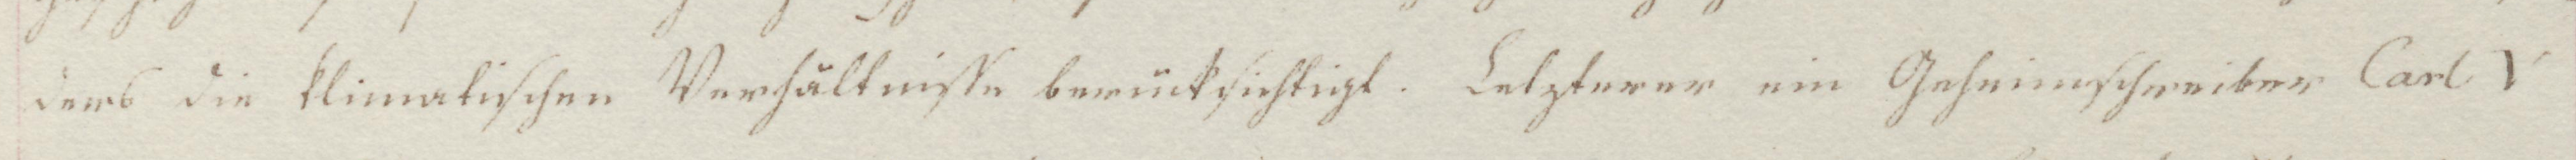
ders die klimatischen Verhältnisse berücksichtigt. Letzterer ein Geheimschreiber Carl V
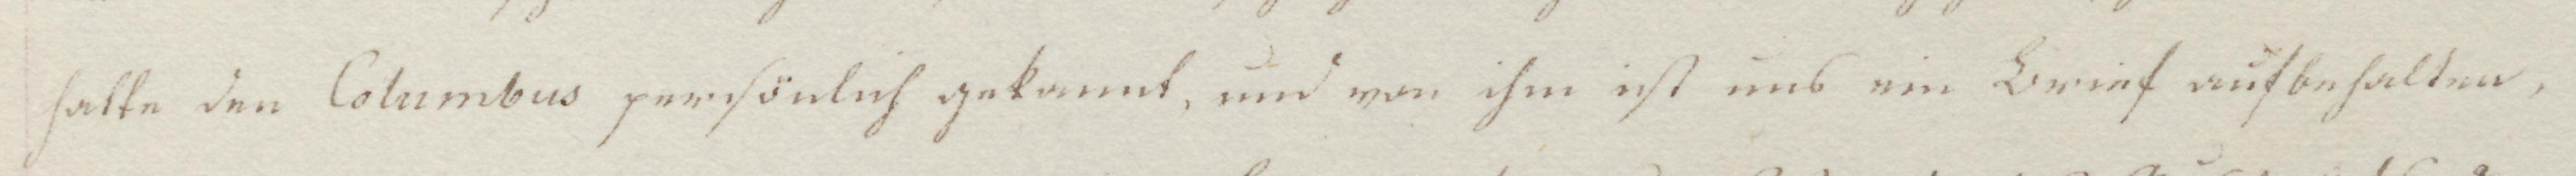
hatte den Columbus persönlich gekannt, und von ihm ist uns ein Brief aufbehalten,
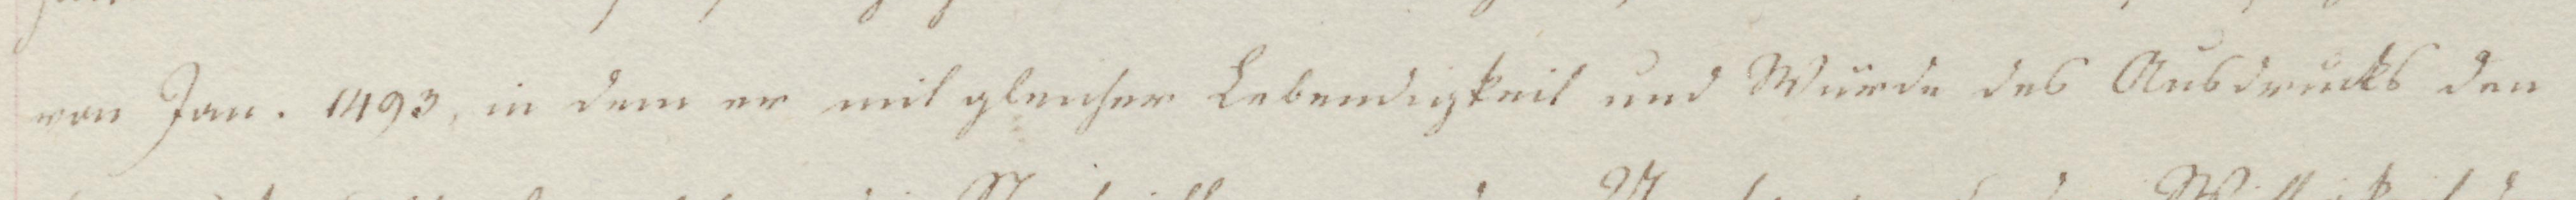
vom Jan. 1493, in dem er mit gleicher Lebendigkeit und Würde des Ausdrucks den
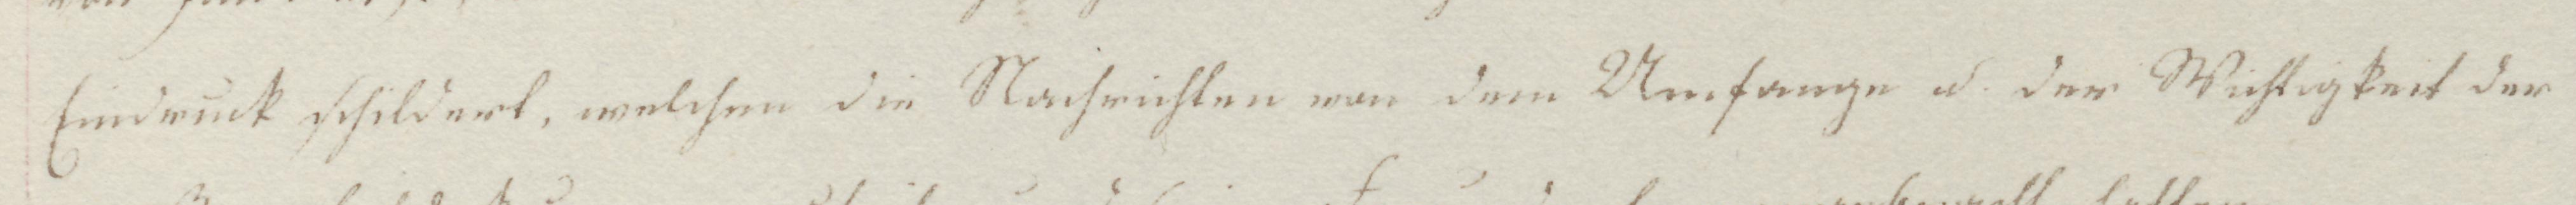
Eindruck schildert, welchen die Nachrichten von dem Umfange u. der Wichtigkeit der
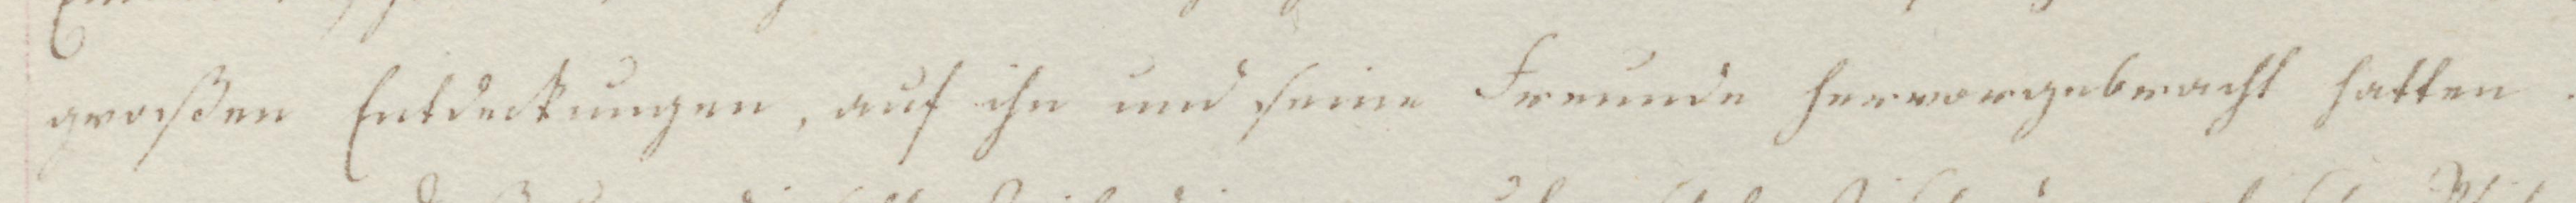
großen Entdeckungen, auf ihn und seine Freunde hervorgebracht hatten.
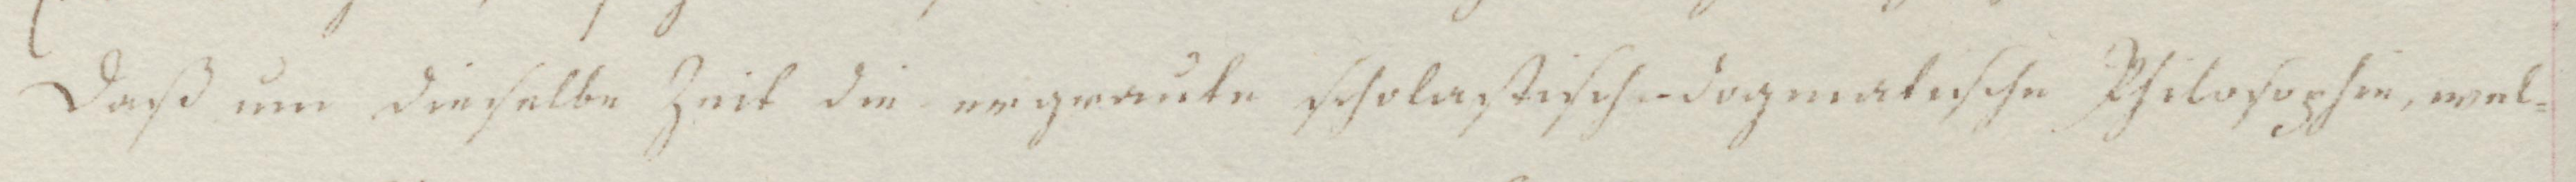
Daß um dieselbe Zeit die ergraute scholastisch-dogmatische Philosophie, wel-
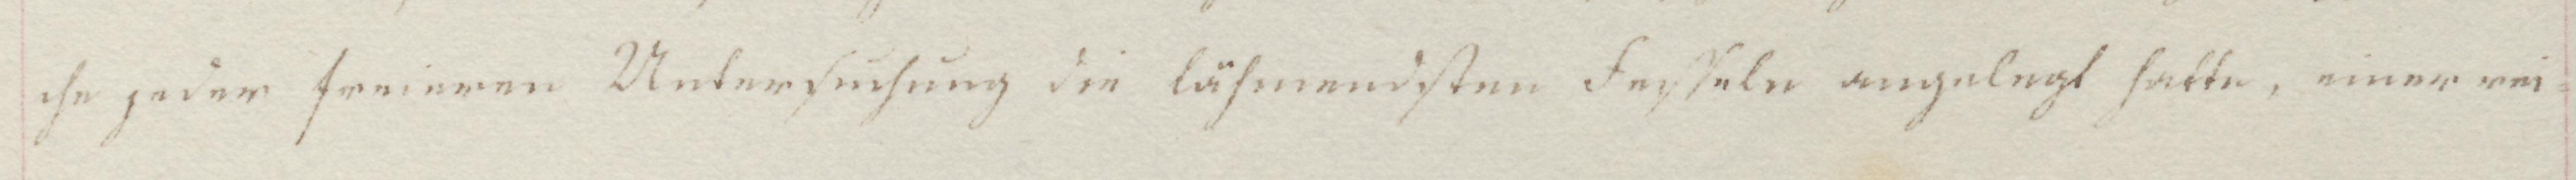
che jeder freieren Untersuchung die lähmendsten Fesseln angelegt hatte, einer rei-
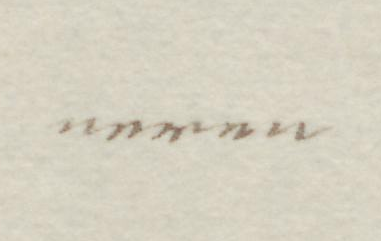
neren
